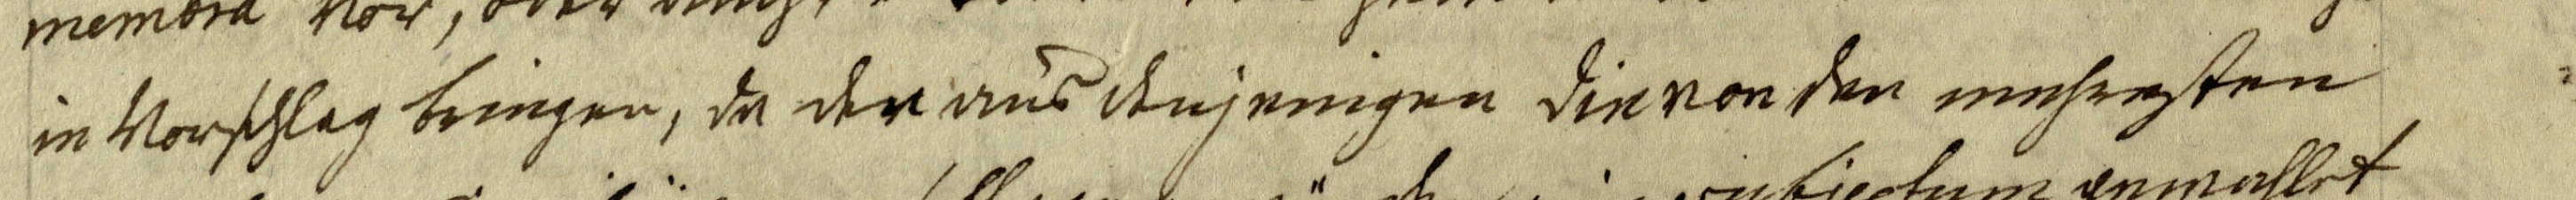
in Vorschlag bringen, da der aus denjenigen die von den mehrsten
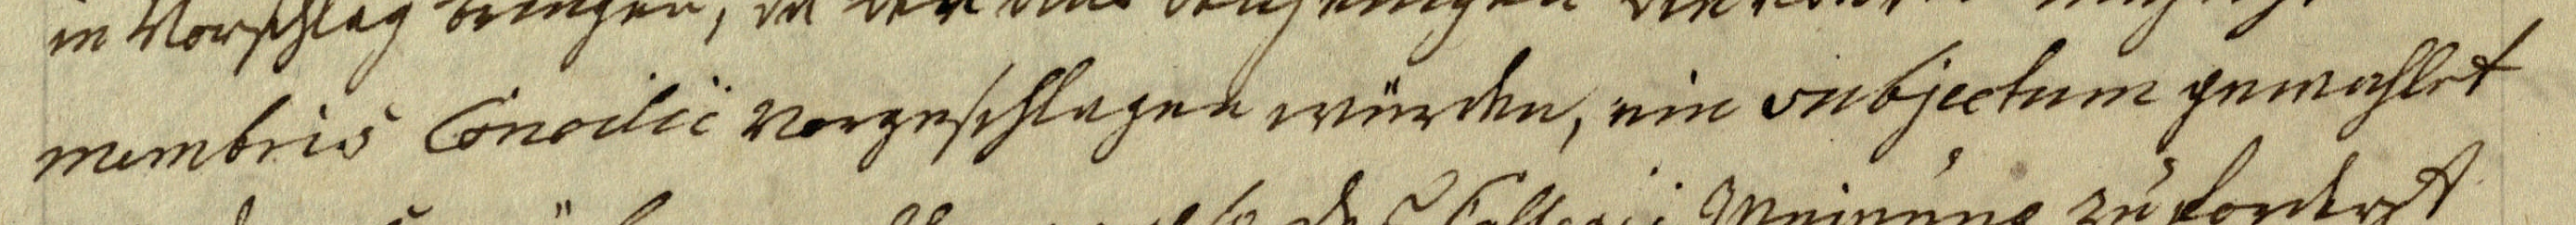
membris Concilii vorgeschlagen würden, ein subjectum gewahlet
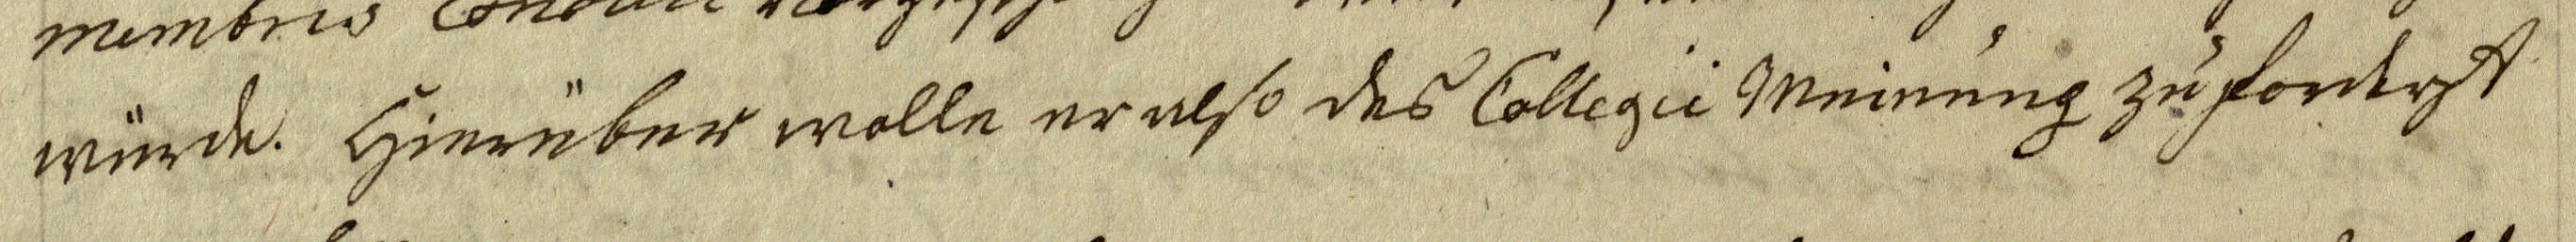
würde. Hierüber wolle er also des Collegii Meinung zuforderst
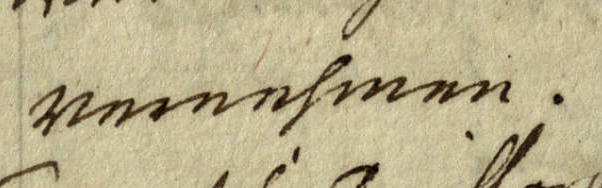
vernehmen.
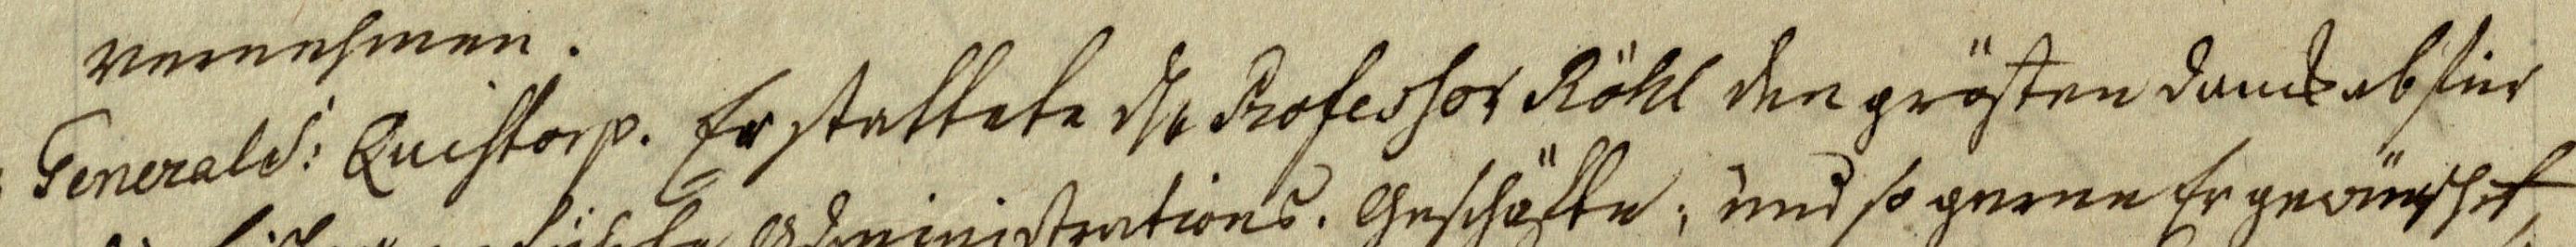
dh GeneralS. Quistorp. Er stattete dh. Professor Röhl den größten Dank ab für
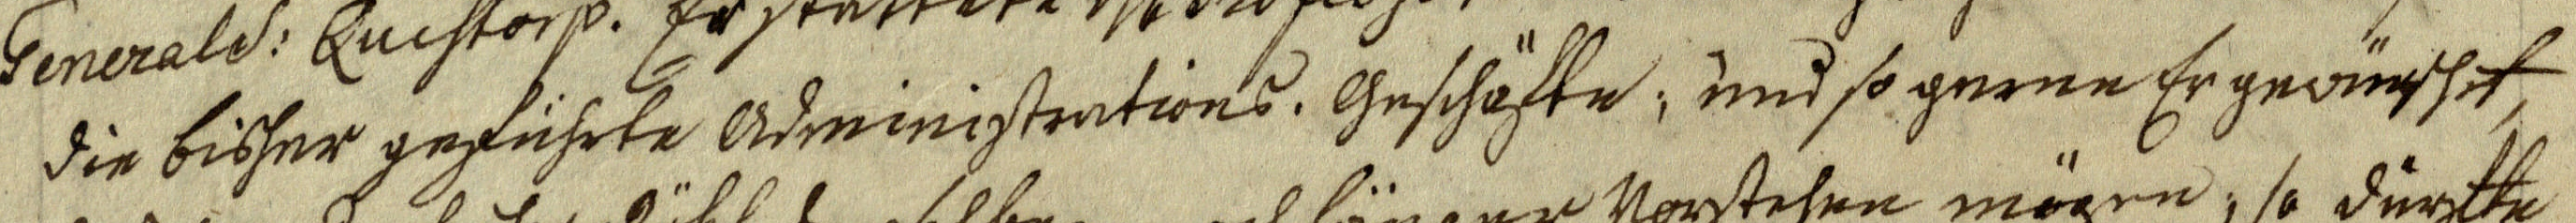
die bisher geführte Administrations Geschäfte, und so gerne Er gewünschet,
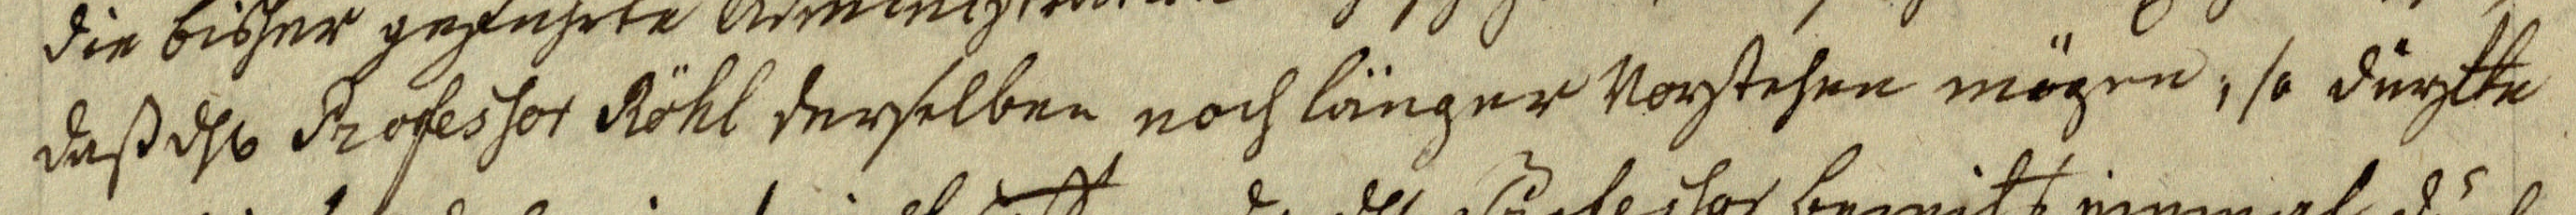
daß dh Professor Röhl derselben noch länger vorstehen mögen, so dürfte
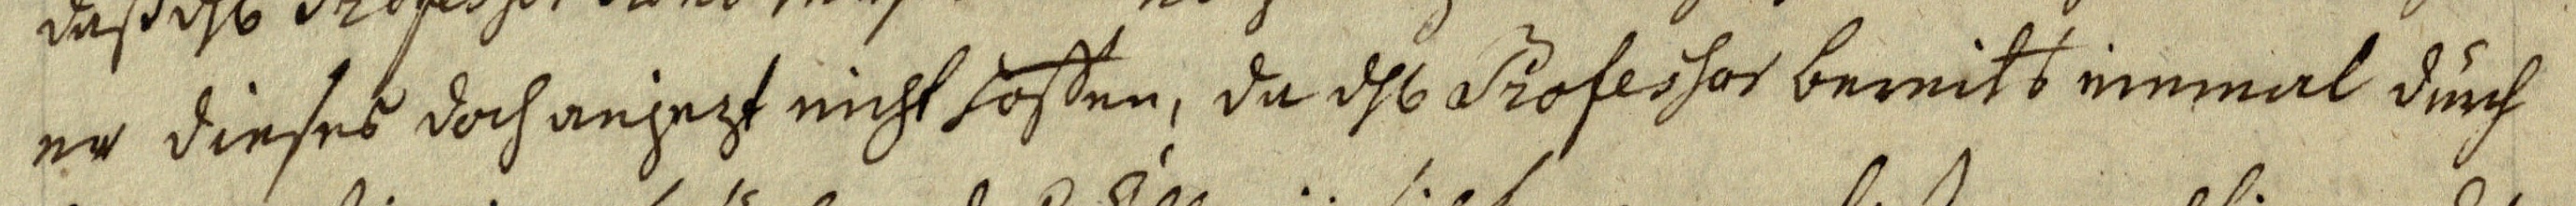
er dieses doch anjezt nicht hoffen, da dh Professor bereits einmal durch
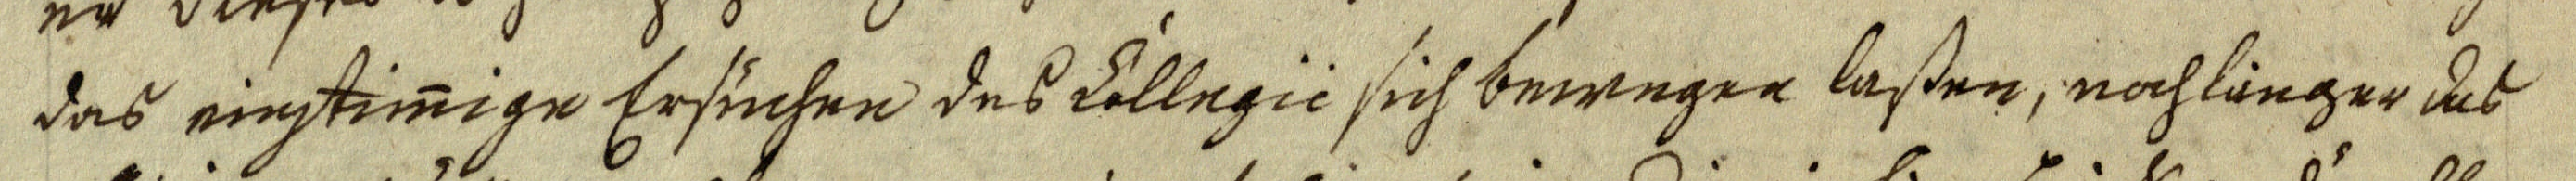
das einstimige Ersuchen des Collegii sich bewegen laßen, noch länger das
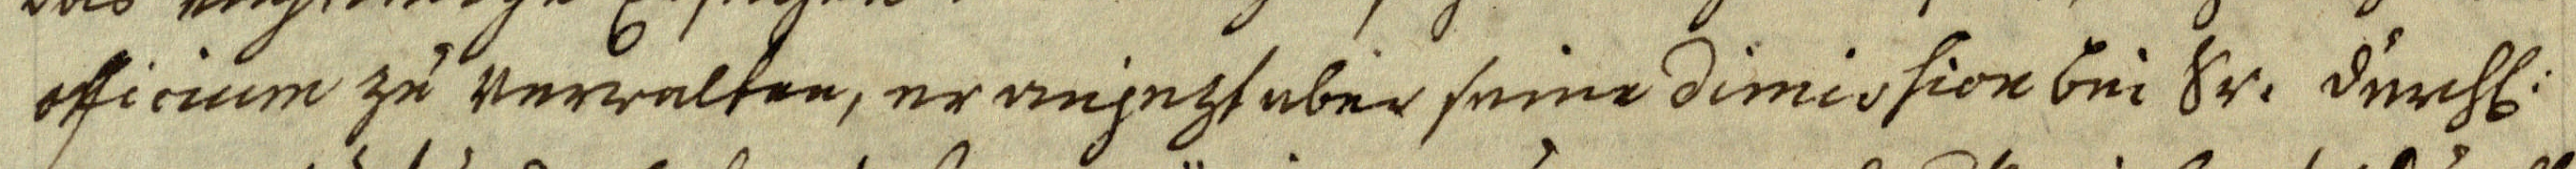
officium zu verwalten, er anjezt aber seine dimission bei Sr Durchl.
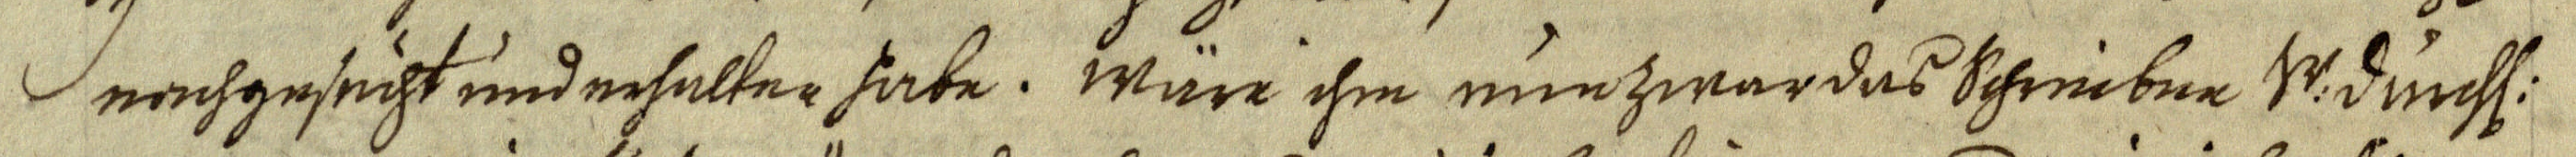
nachgesucht und erhalten habe. Wäre ihm nunzwar das Schreiben Sr Durchl.
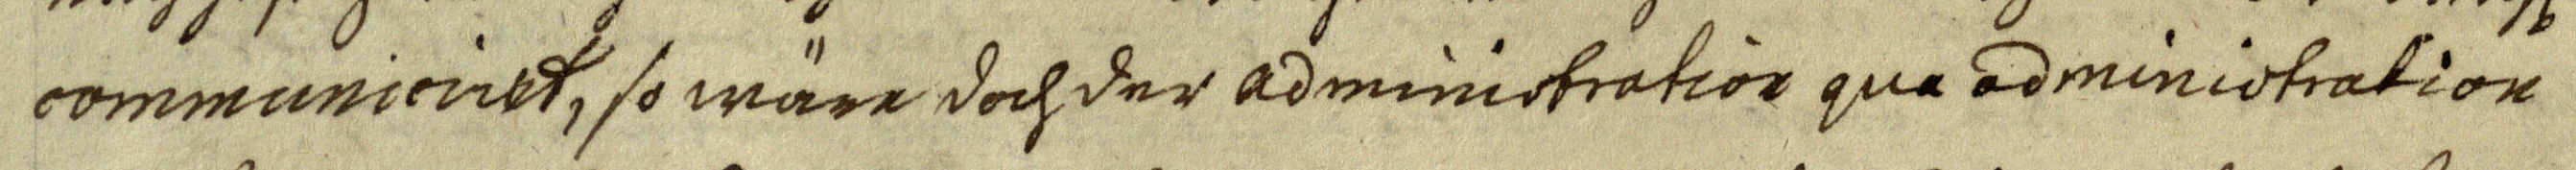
communiciret, so wäre doch der Administration qua administration
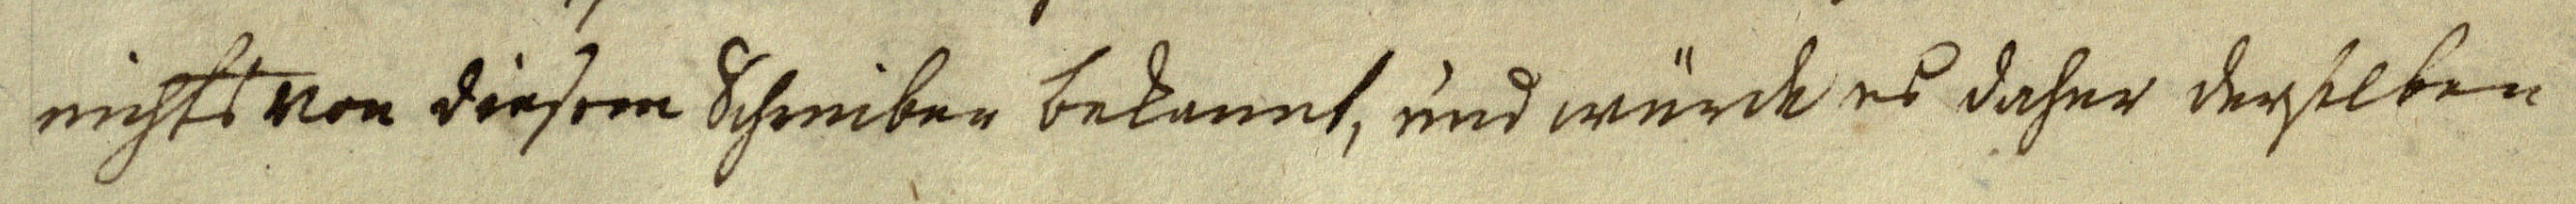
nichts von diesem Schreiben bekannt, und würde es daher derselben
